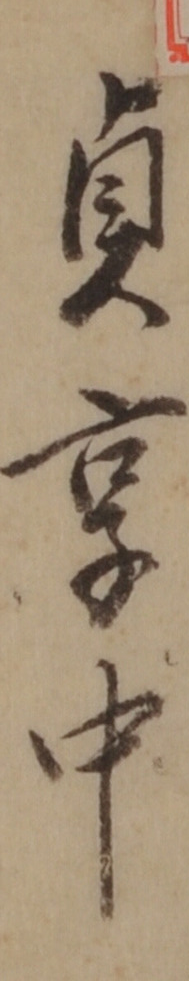貞享中
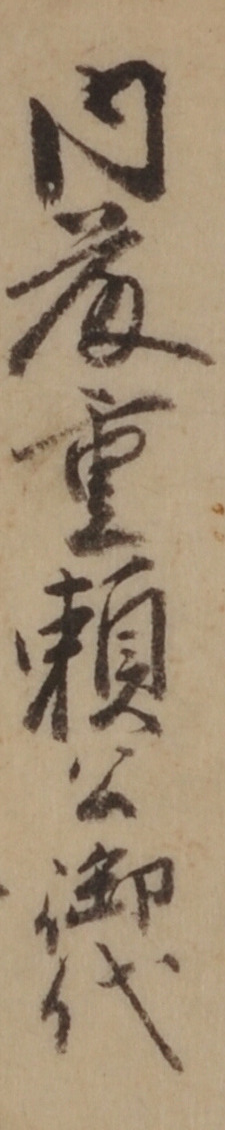内藤重頼公御代
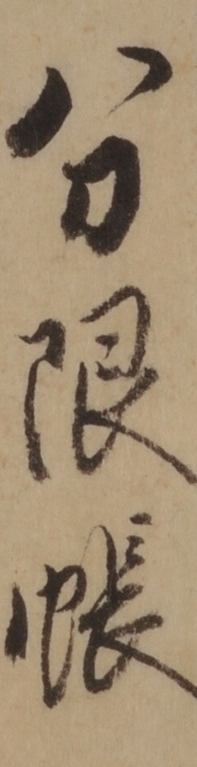分限帳

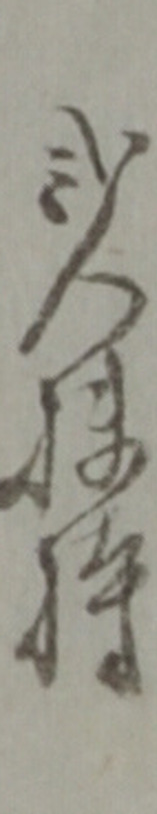弐人扶持
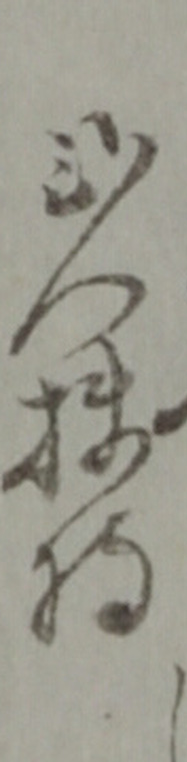弐人扶持
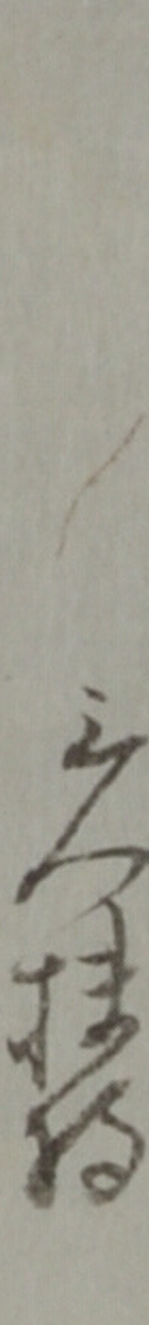三人扶持
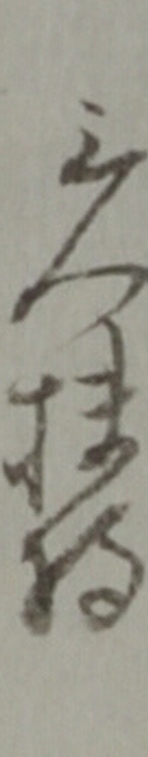三人扶持
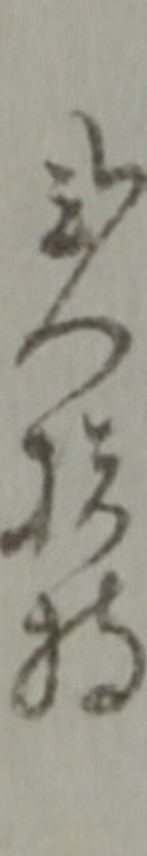弐人扶持
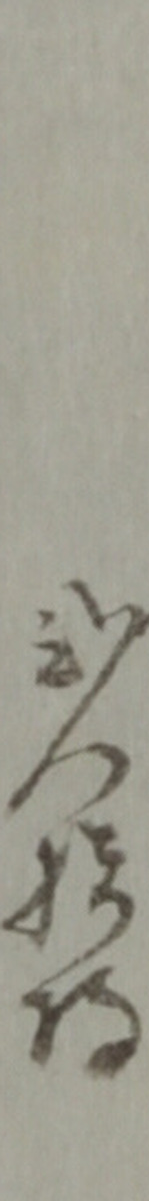弐人扶持
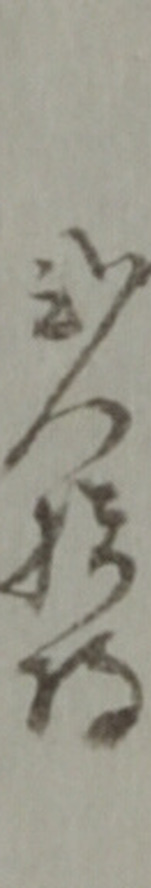弐人扶持
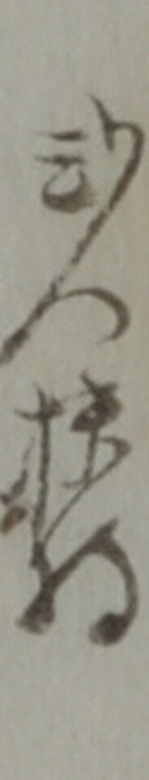弐人扶持
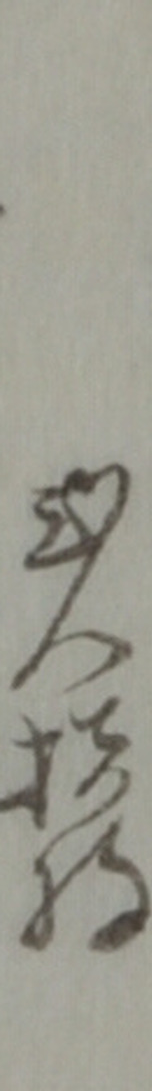弐人扶持
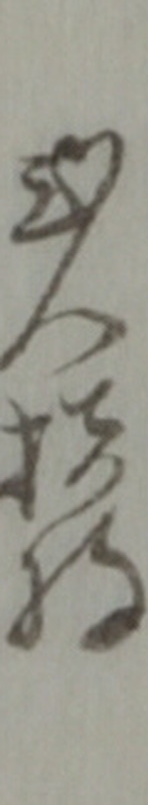弐人扶持
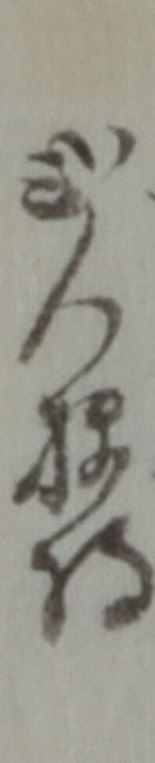弐人扶持
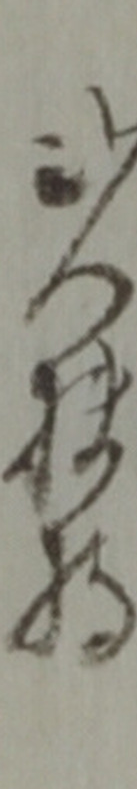弐人扶持
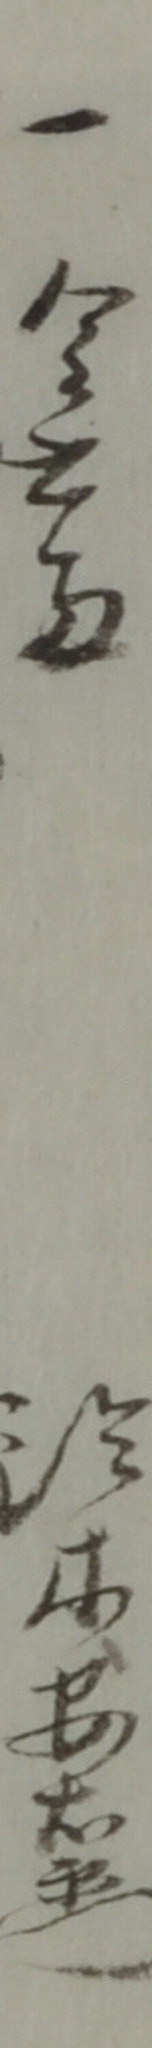一金六両鈴木安右衛門
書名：内藤重頼公御代分限帳（写）
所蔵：伊那市立高遠町図書館・合同会社AMANE
